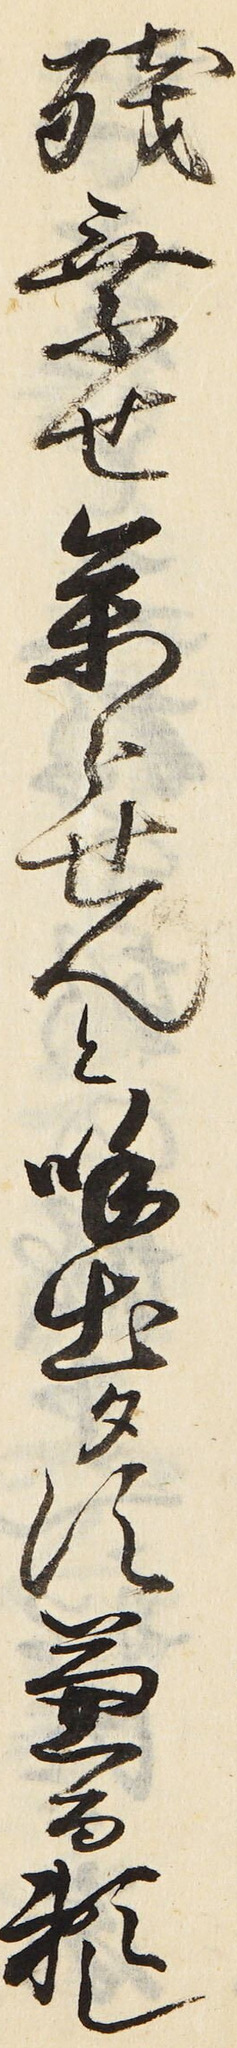残乗せ参らせんと呼出たす兼而頼し
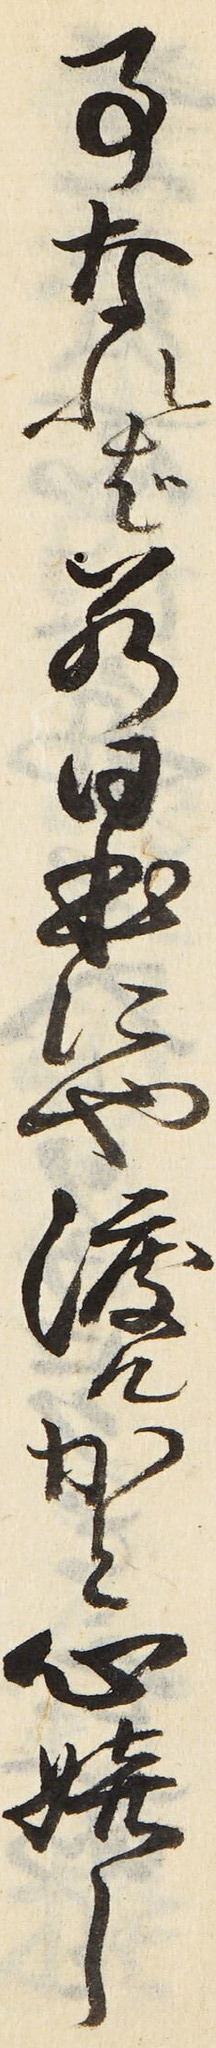事なれば若日本にや渡るかと心嬉し
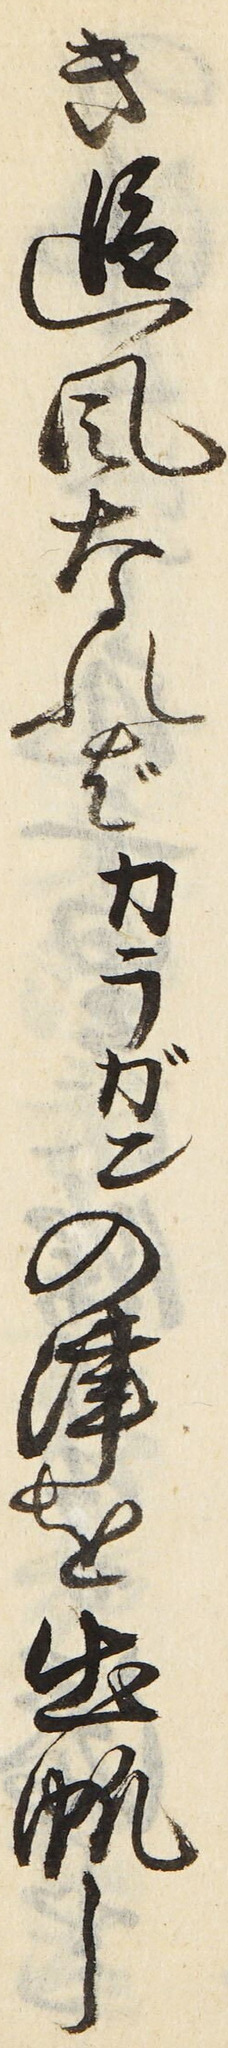き追風なればカラガンの津を出帆し
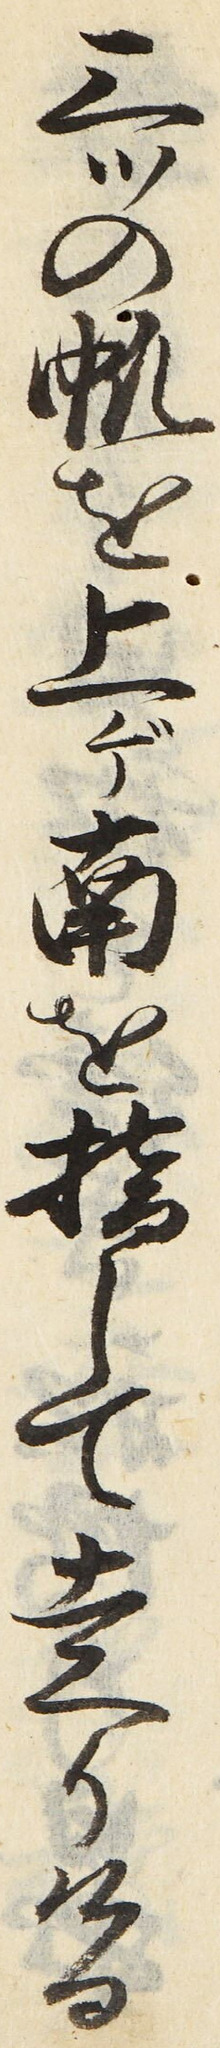三ッの帆を上げ南を指して走りける
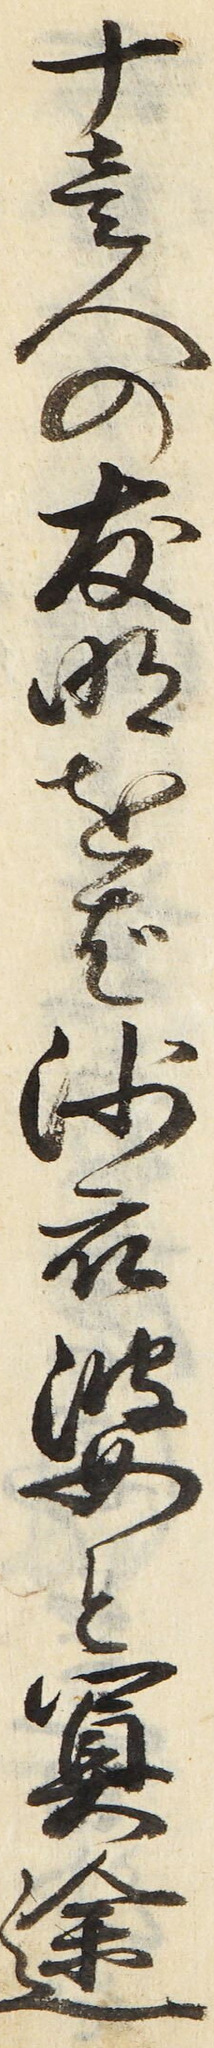十壱人の友朋をば沙衣婆と冥途
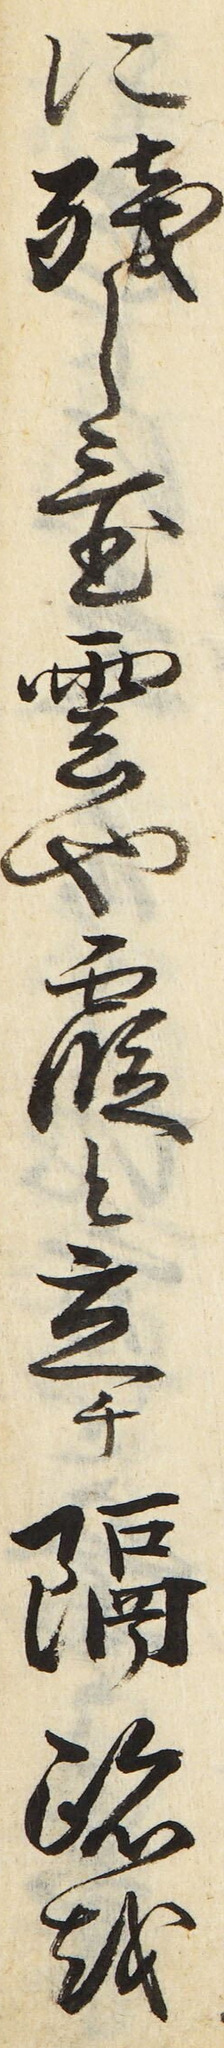に残し置雲や霞と立ち隔跡を

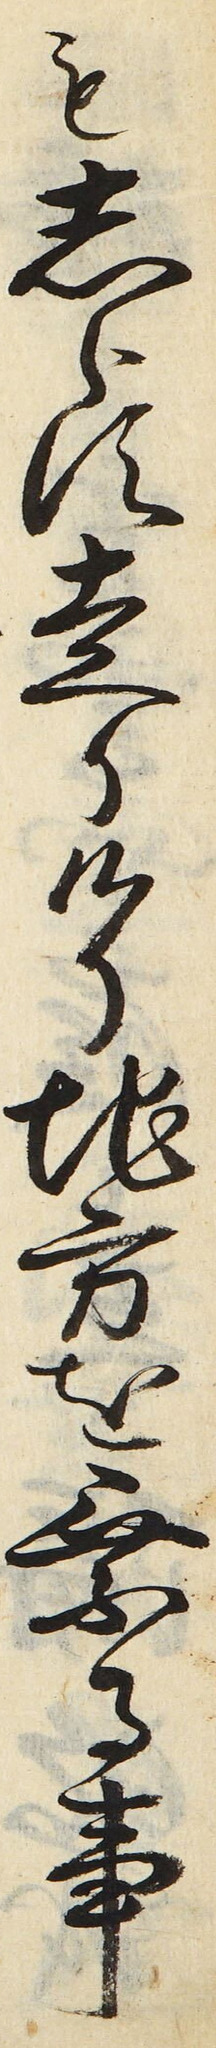もしらす走りけり地方を乗る事
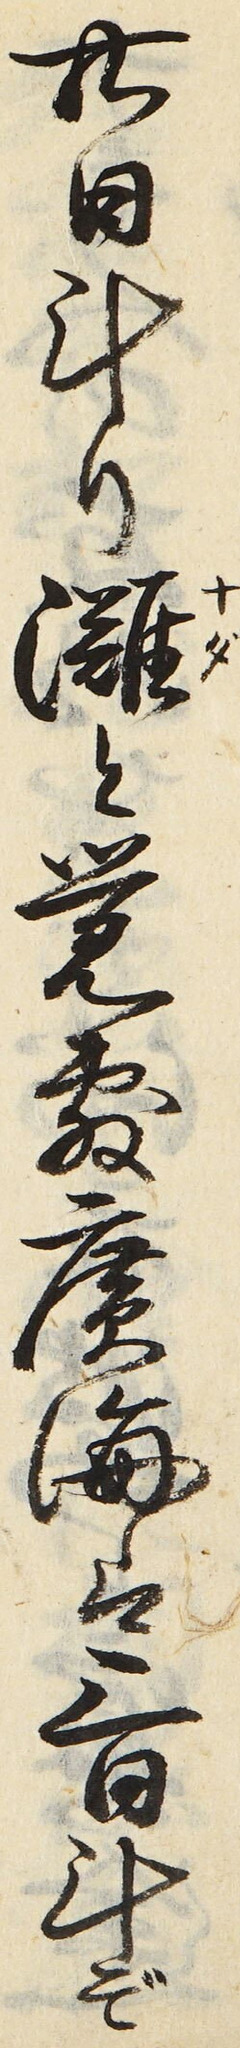廿日計り灘と覚敷広海は三日計ぞ
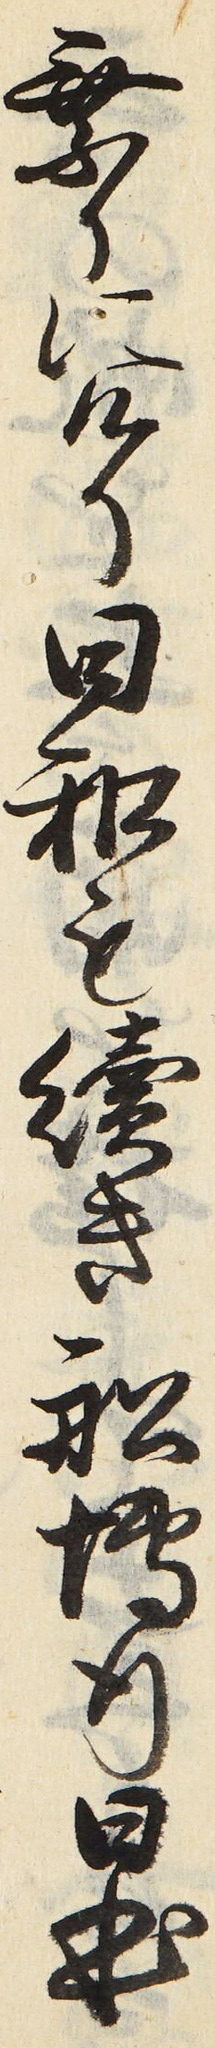乗りにけり日和も続き船博行日本
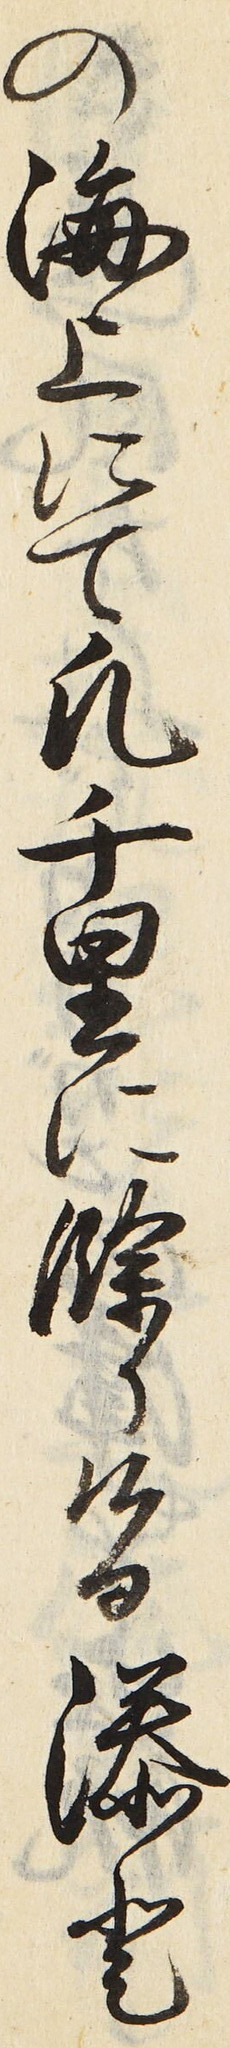の海上にて凡千里に余りける湊と
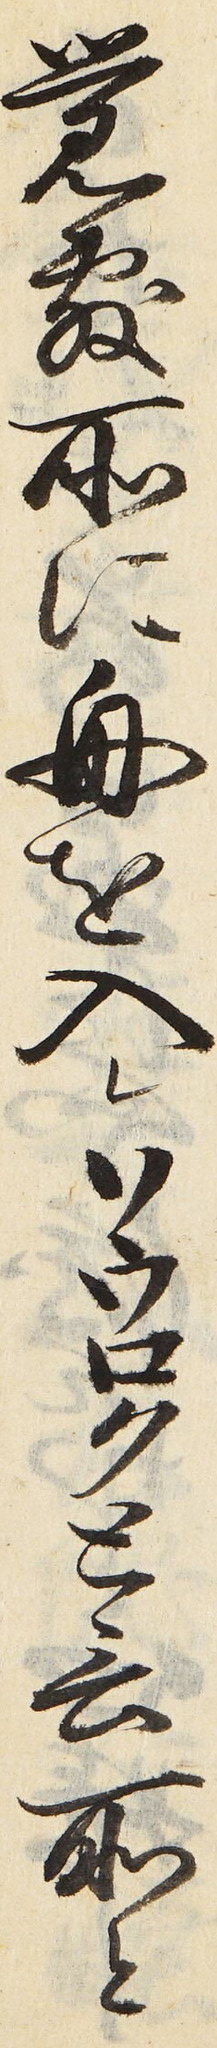覚敷所に舟を入れソウロクと云所と
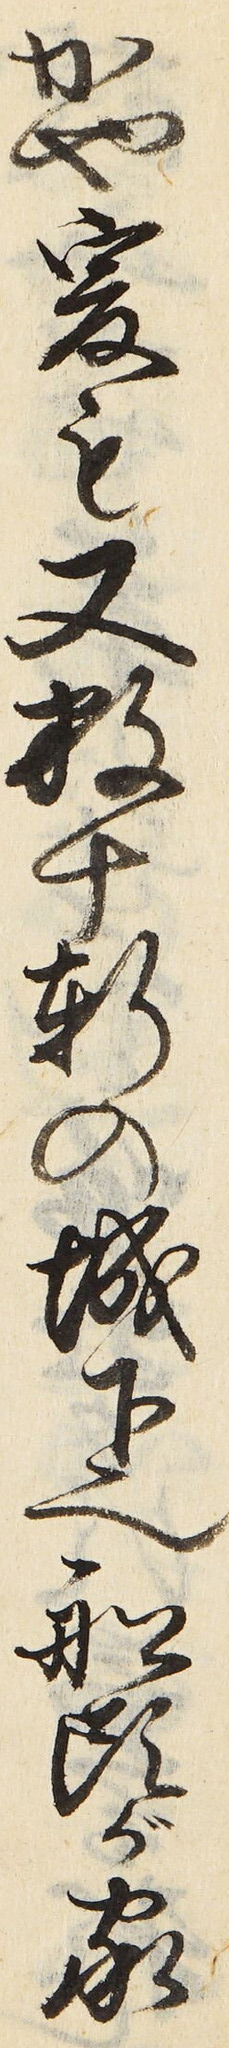かや爰も又数十軒の城下也船頭が家
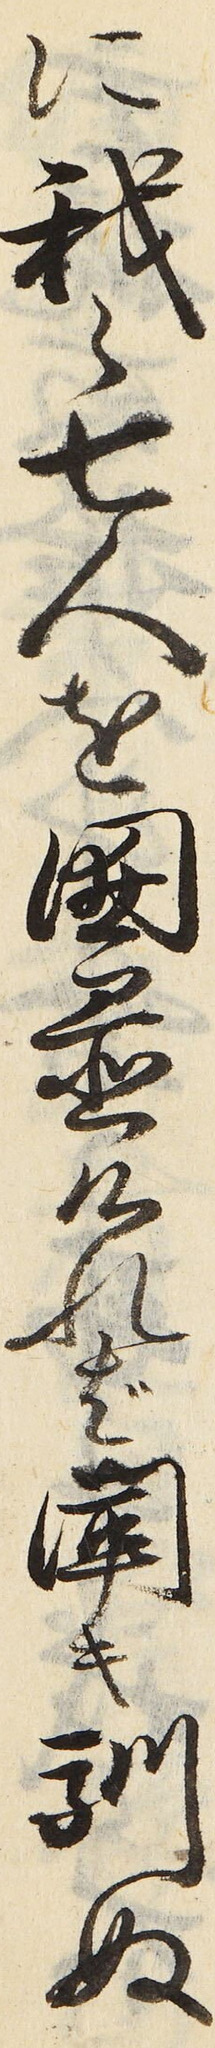に我々七人を囲置ければ聞き馴ぬ
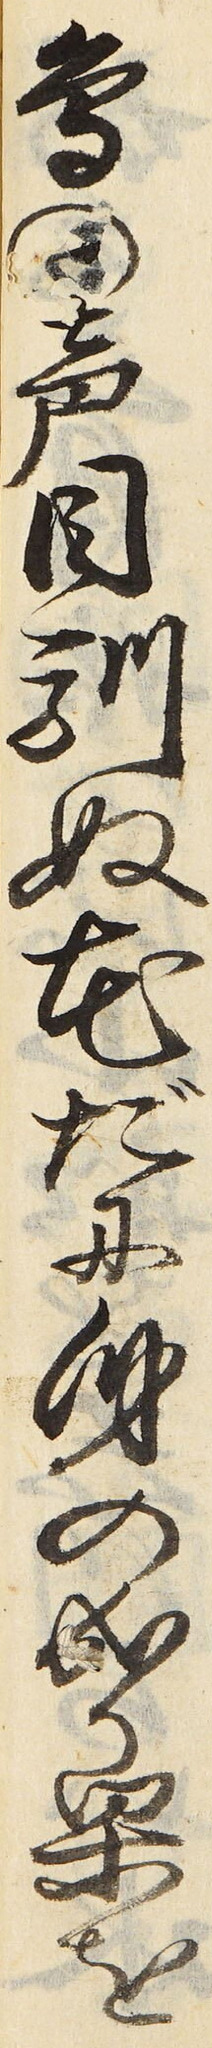鳥の声目馴ぬ花だに身の成り果を
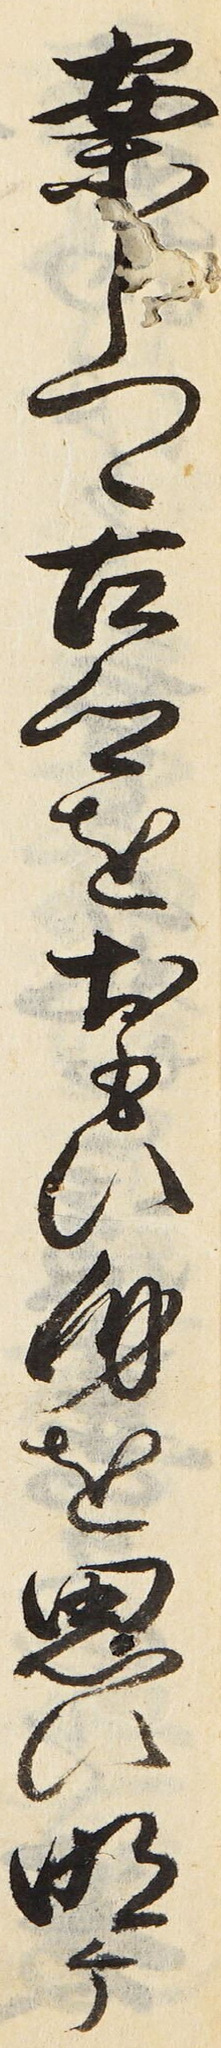案じつゝ古郷をおもひ身を思ひ明け
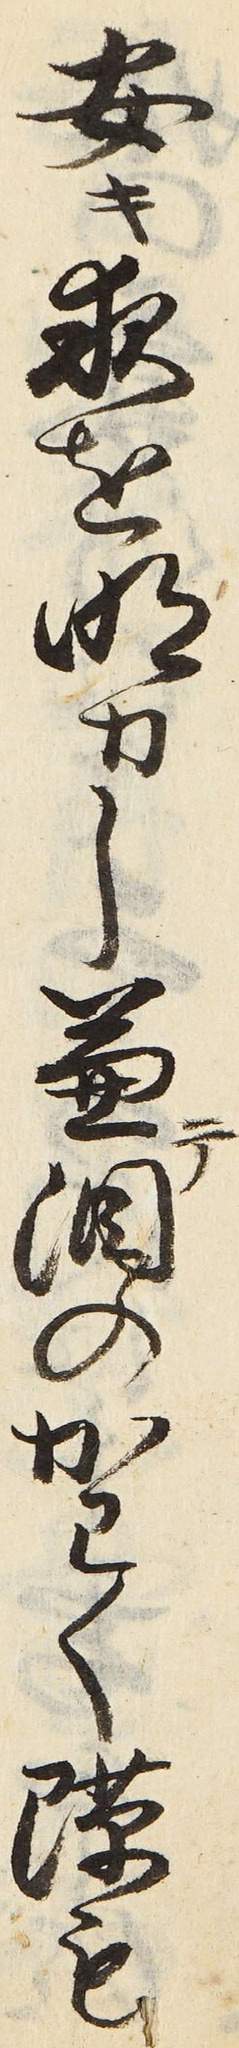安き夜を明かし兼て泪のかわく隙も
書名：華夷九年録
